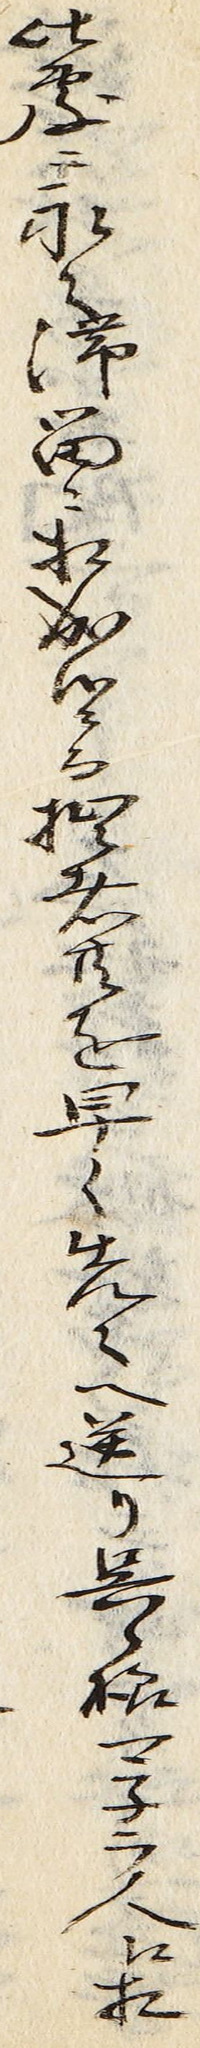此処ニ永々之滞留ニ相成候ニ而拙者共を早く先々へ送り呉候様マネラ人江相
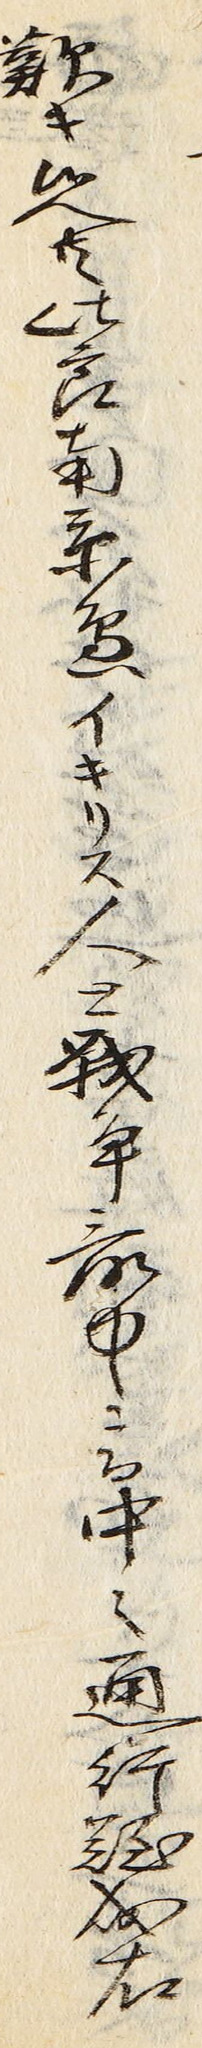歎キ候へ共此節南京辺イキリス人と戦争最中ニ而中々通-行難成右

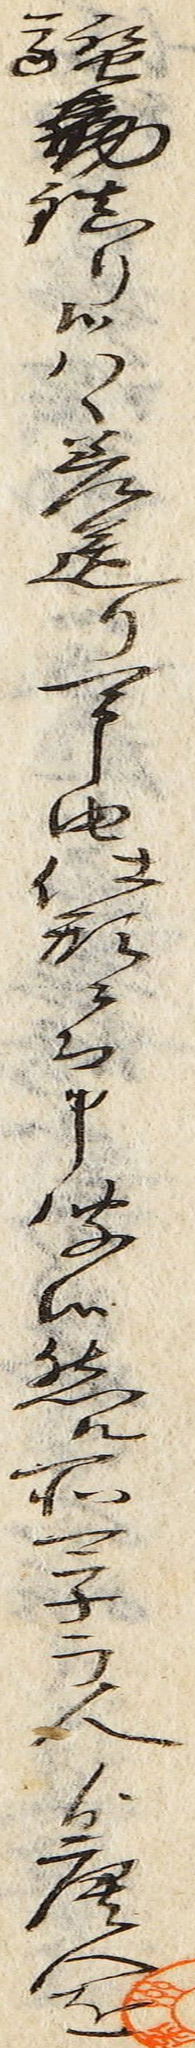騒動鎮り候ハヽ差送り可申由仕形ニ而申聞候然ル所マネラ人ゟ唐人を
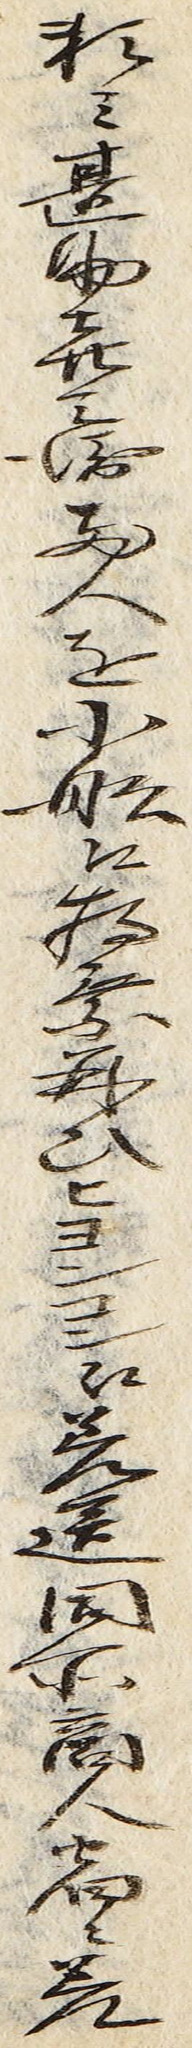頼ミ甚助喜兵衛両人を小船江持乗再ひヒヨンコン江差送同所商人宿ニ差
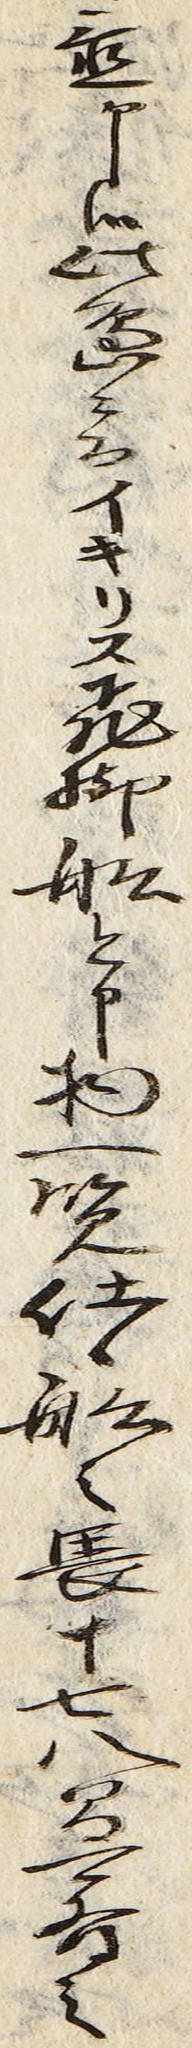置申候此島ニ而イキリス飛脚船と申物一覧仕候船之長十七八間可有之
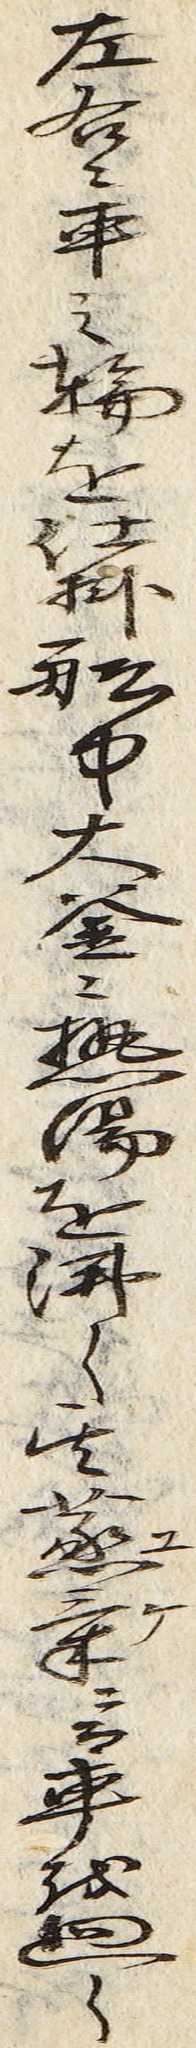左右ニ車之輪を仕掛船中大釜ニ熟湯を沸し其蒸気ニ而車を廻し
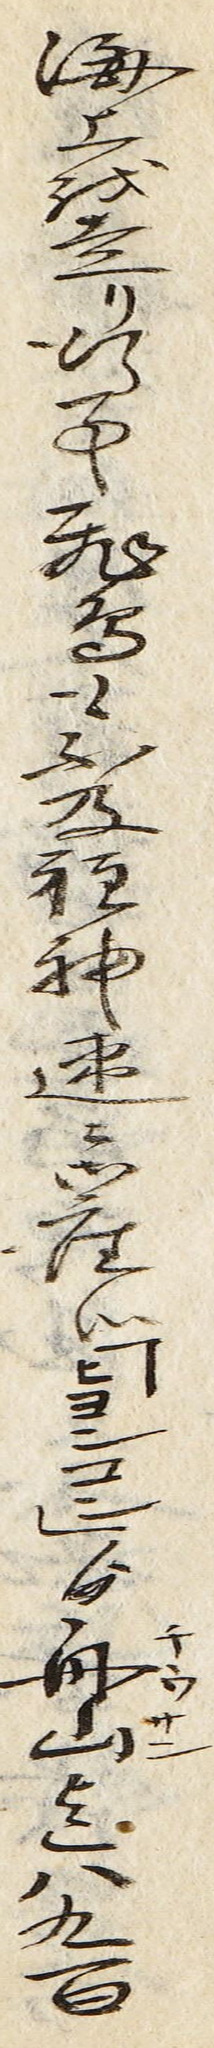海上を走り行事飛鳥も不及程神速ニ御座候「ヒヨンコン」ゟ舟山迄八九百
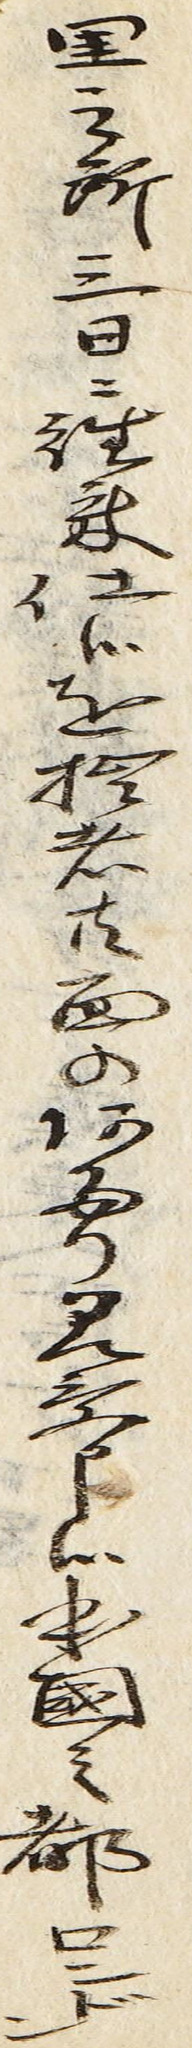里之所三日往来仕候を拙者共西のあたり見受申候本国之都ロンドン
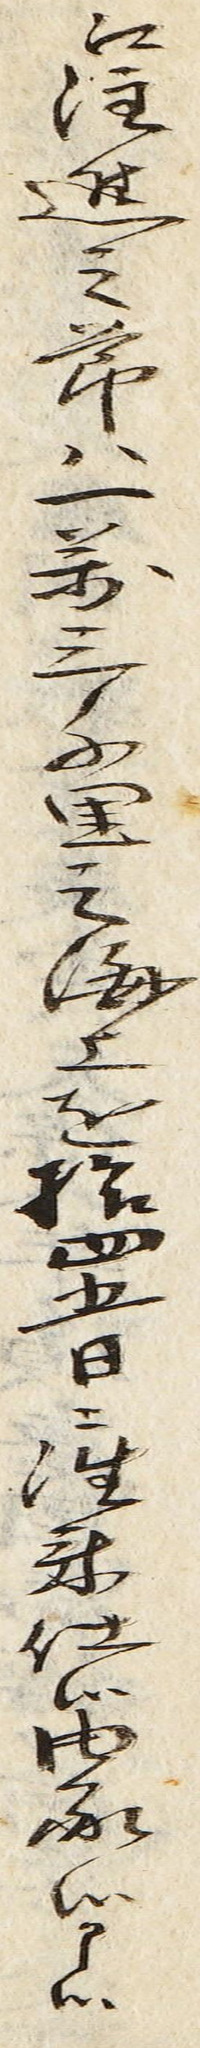江注進之節ハ一万三千里之海上を拾四五日ニ往来仕候由承候申候
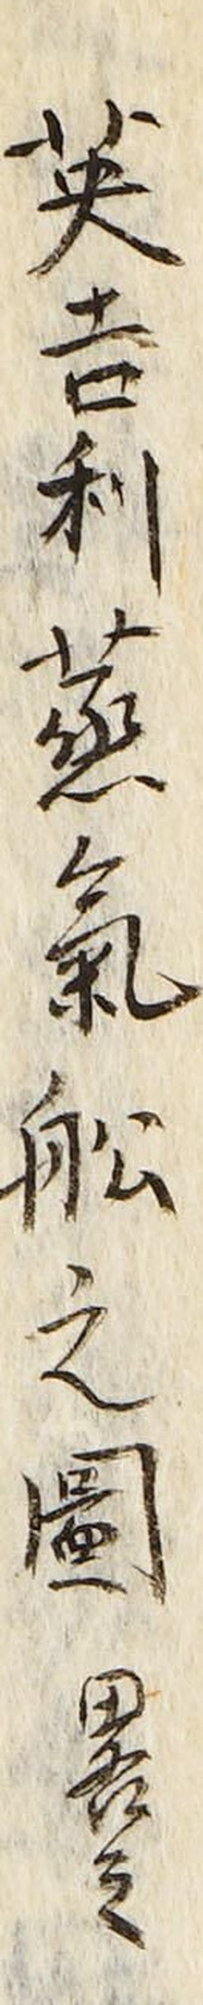英吉利蒸気船之図略之
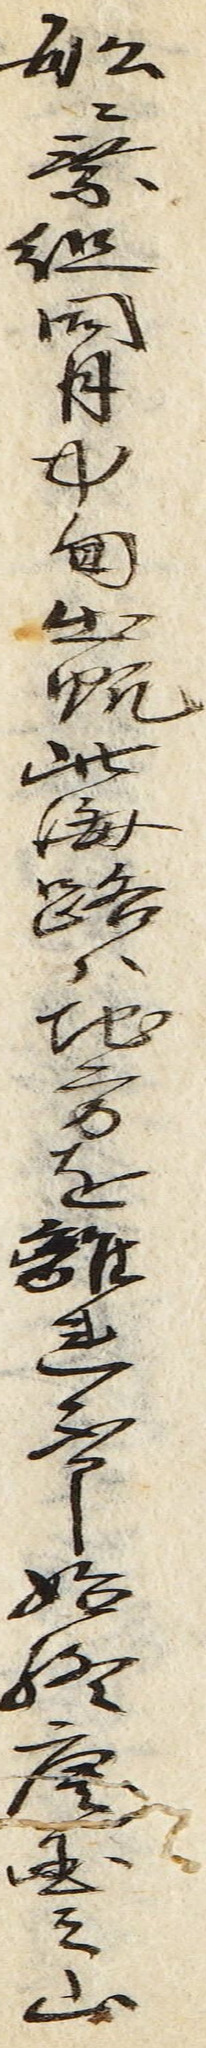船ニ乗組同月中旬出帆此海路ハ地方を離れ不申始終唐国之山
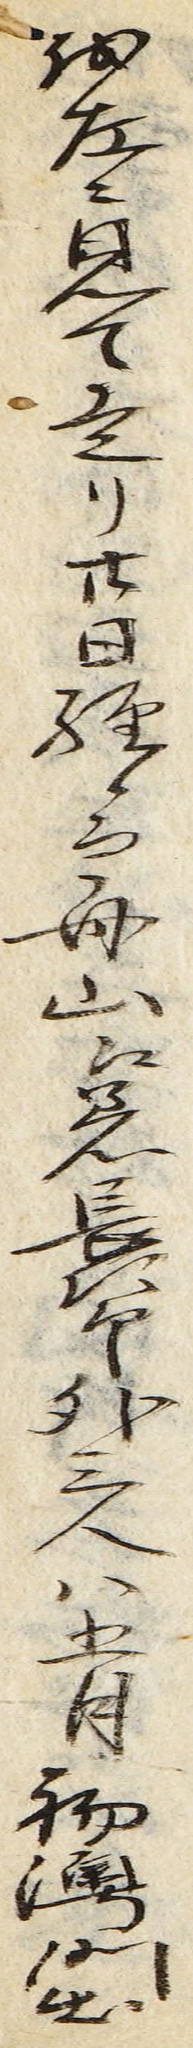を左ニ見て走り廿日経候而舟山江着長次郎外三人ハ五月初澳門出
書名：漂流呂宋国記
